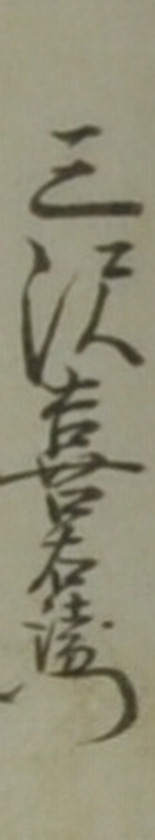三沢喜右衛門

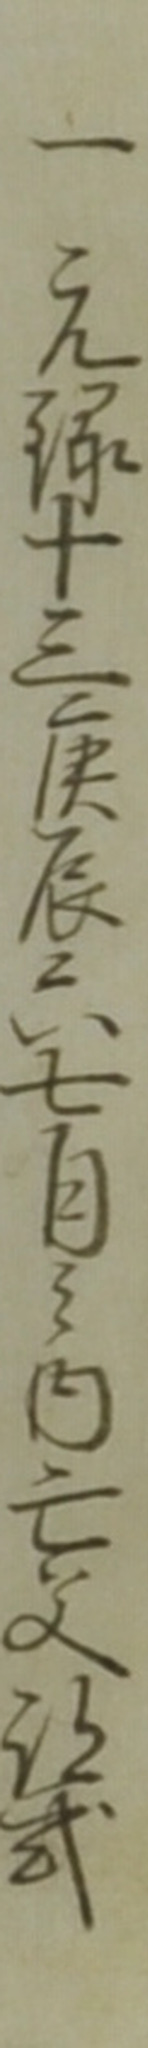一元禄十三庚辰六七月之内亡父跡式
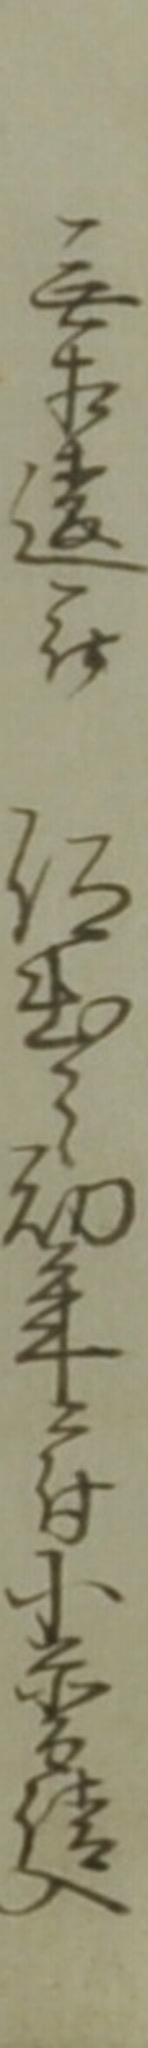無相違被仰出之幼年ニ付小普請入
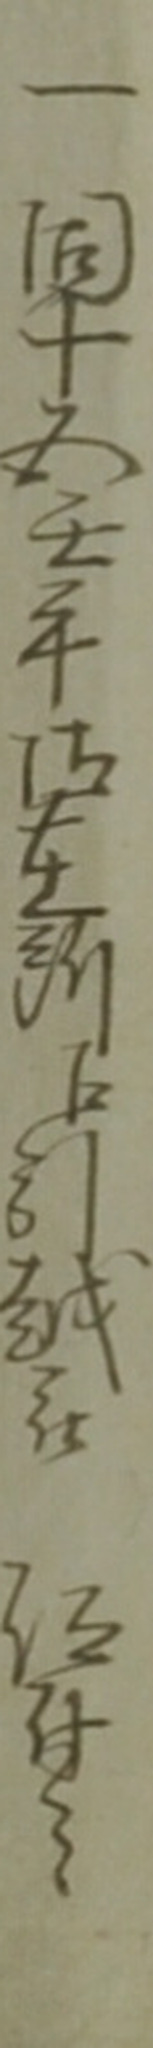一同十五壬午御在所え引越被仰付之
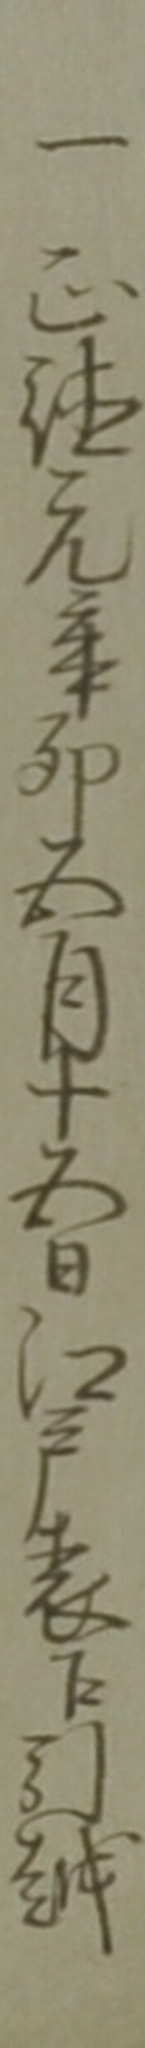一正徳元辛卯五月十五日江戸表江引越
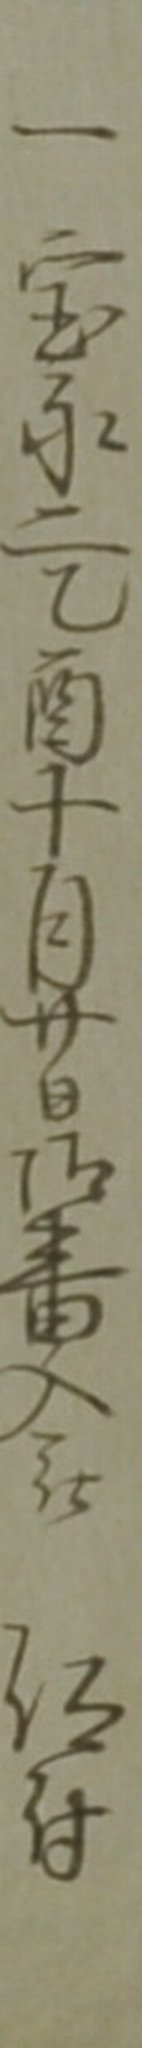一宝永二乙酉十月廿日御番入被仰付
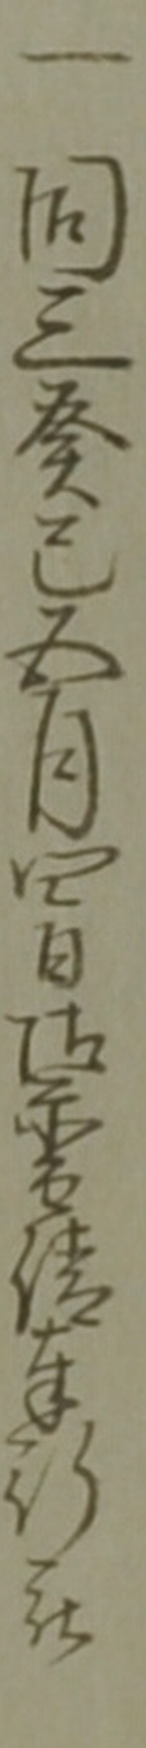一同三癸巳五月四日御普請奉行被
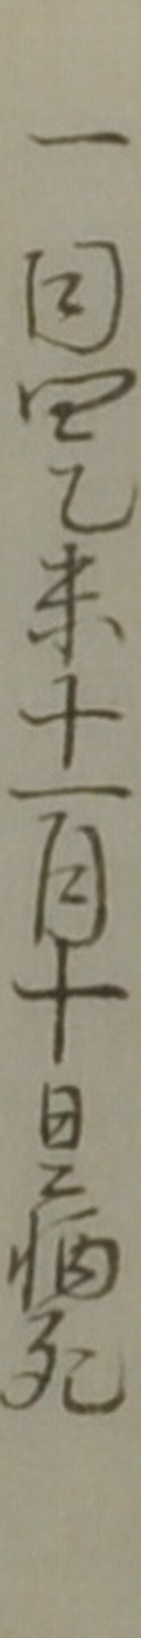一同四乙未十一月十日病死
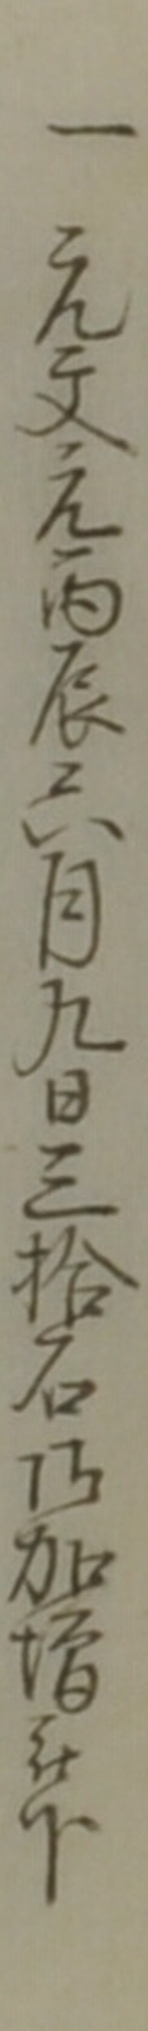一元文元丙辰六月九日三拾石御加増被下
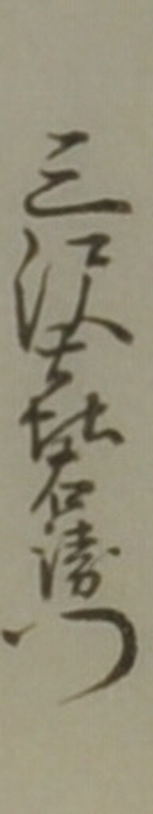三沢喜右衛門
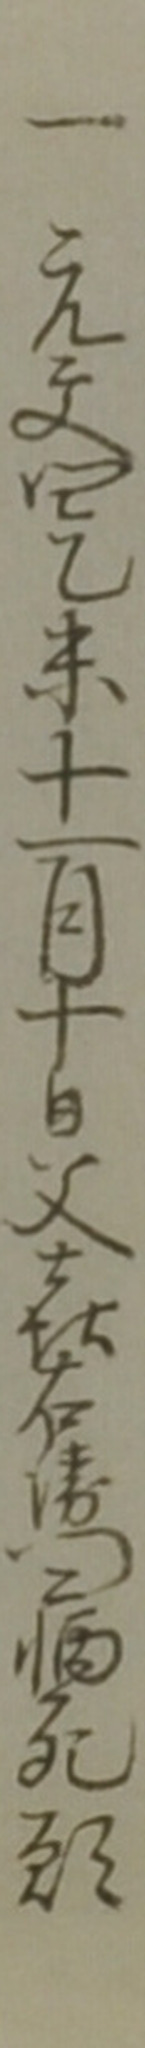一元文四乙未十一月十日父喜右衛門病死願
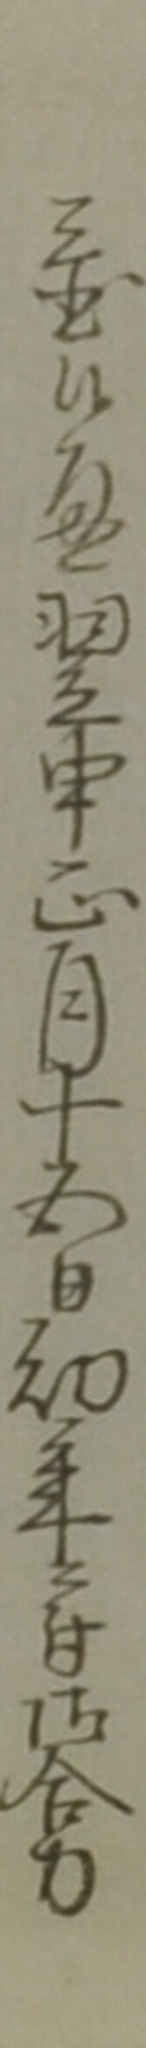置候通翌申正月十五日幼年ニ付御合力
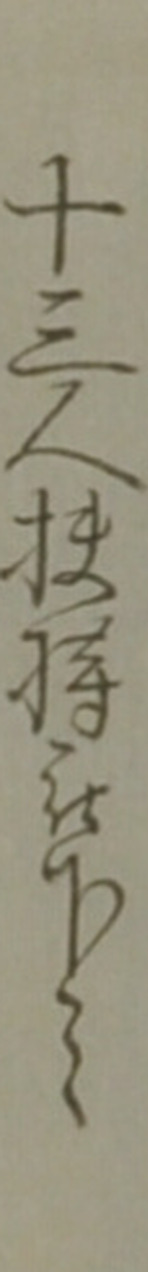十三人扶持被下之
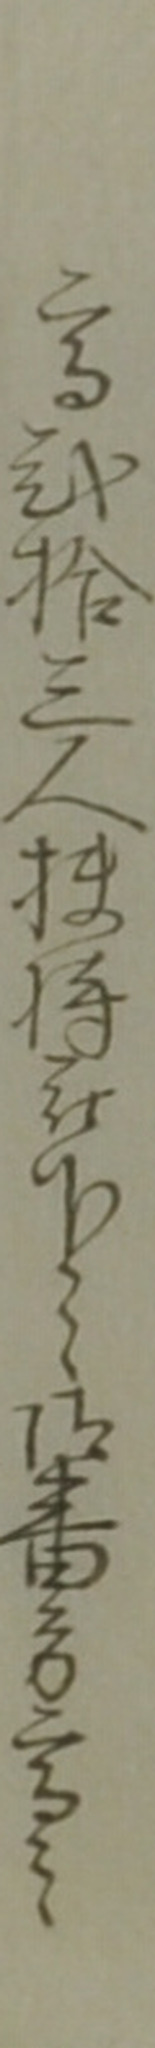高弐拾三人扶持被下之御番方高之
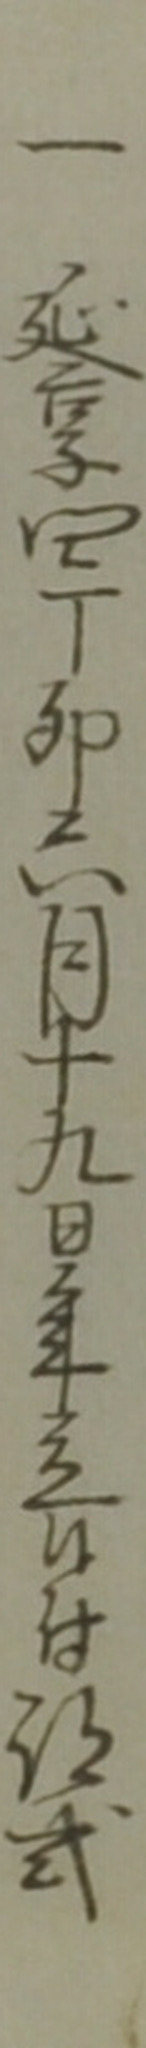一延享四丁卯六月十九日年立候付跡式
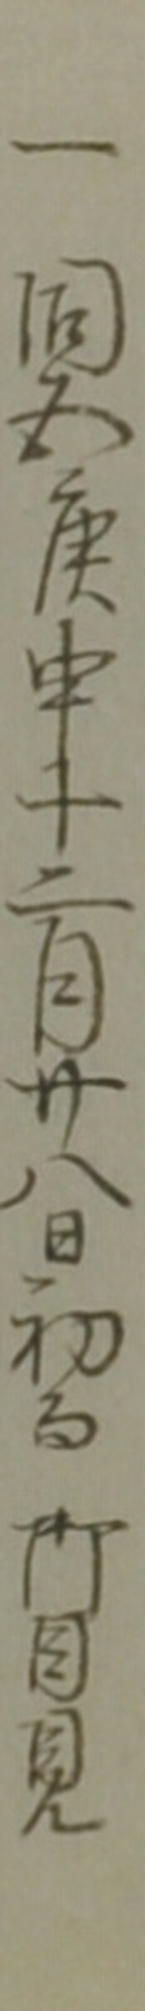一同五庚申十二月廿八日初而御目見
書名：給人諸士勤仕録（三）
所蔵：伊那市立高遠町図書館・合同会社AMANE
